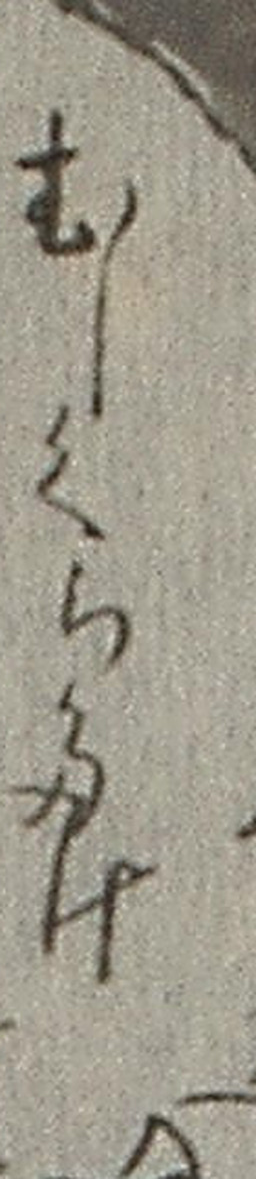むしくらたけ
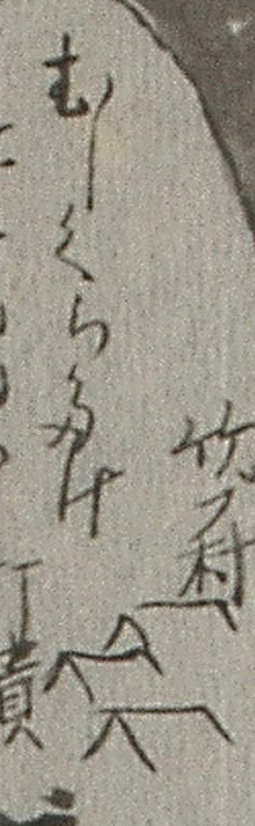むしくらたけ

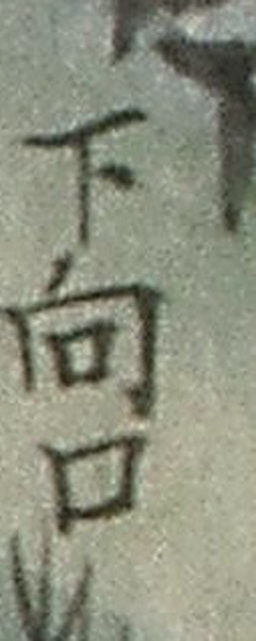下向口
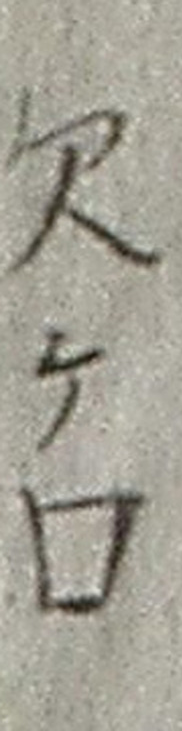欠ヶ口

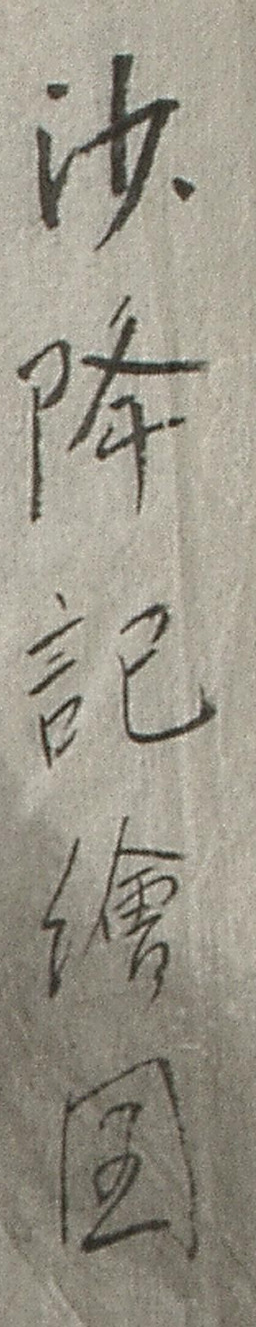沙降記絵図

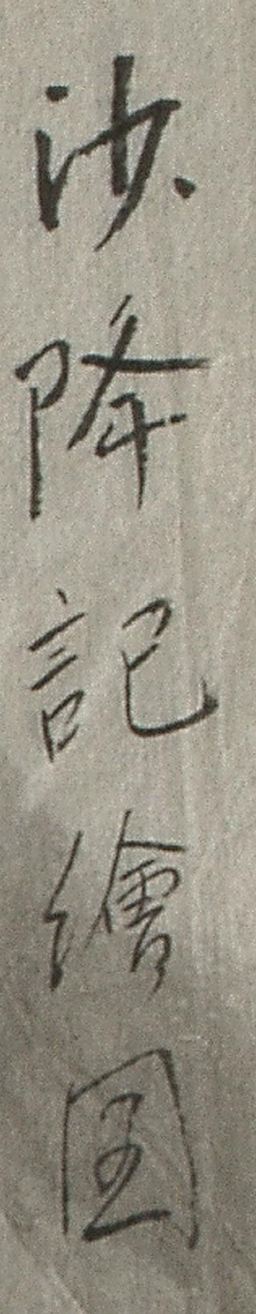沙降記絵図

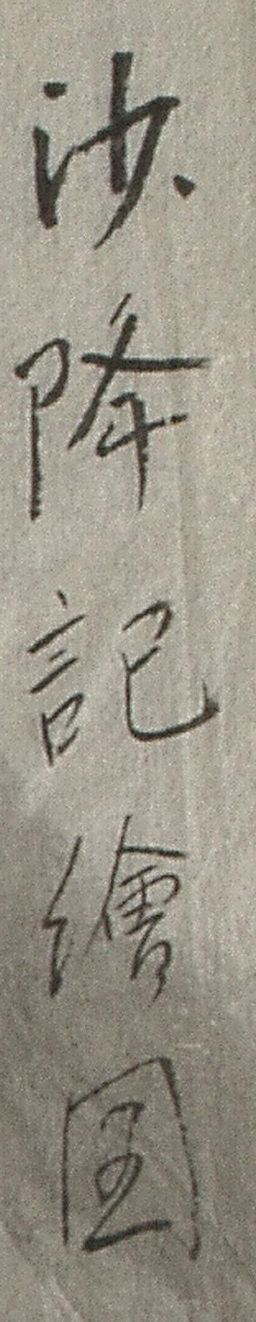沙降記絵図

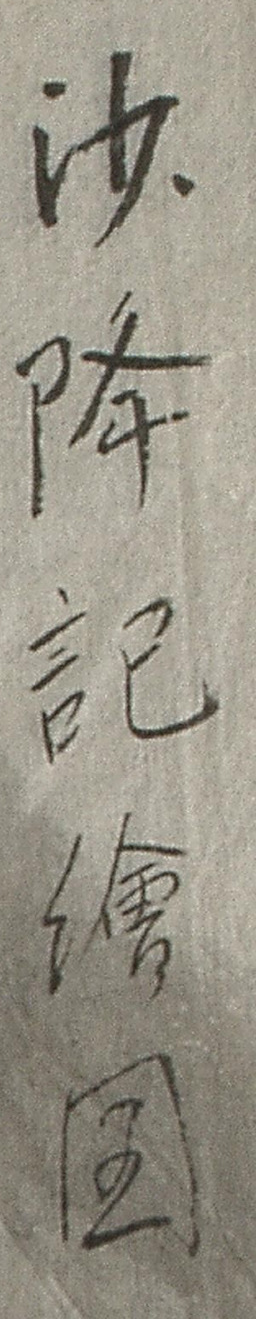沙降記絵図

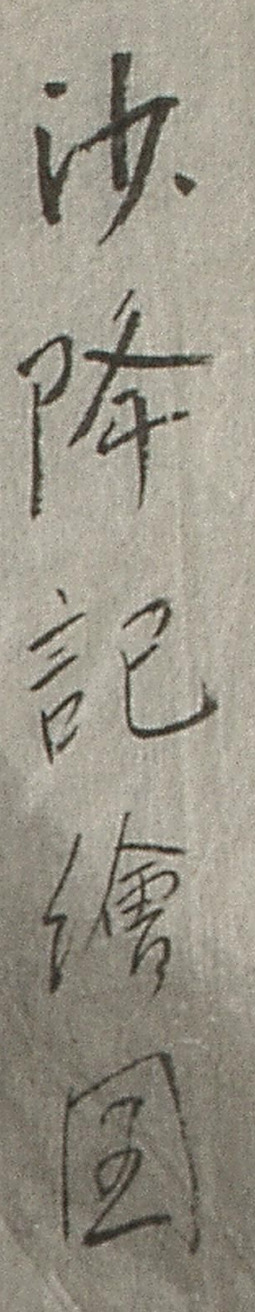沙降記絵図

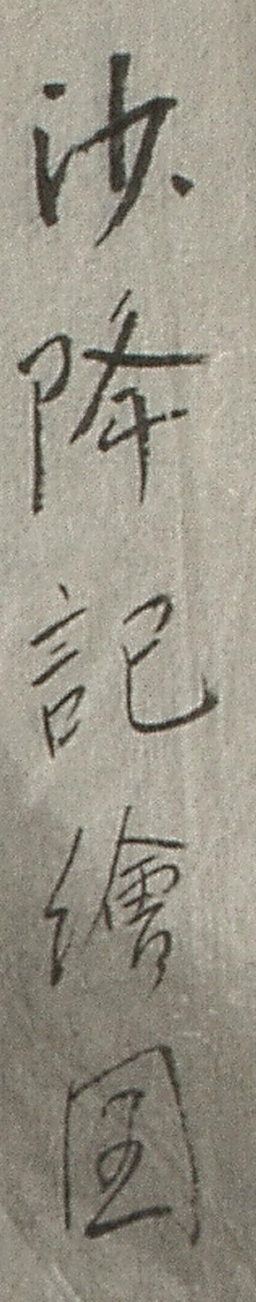沙降記絵図

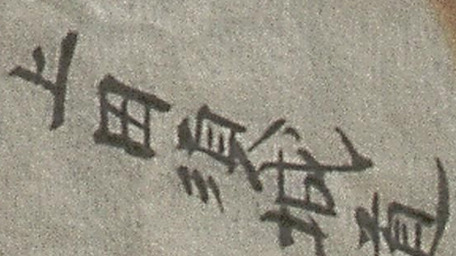上田須城道
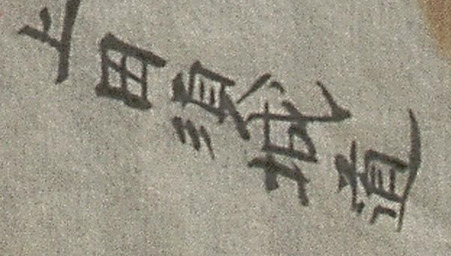上田須城道

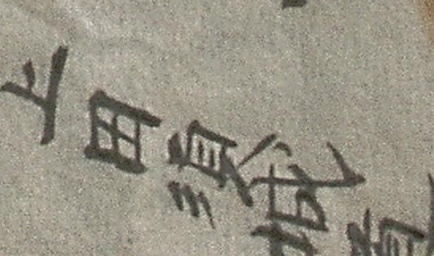上田須城道
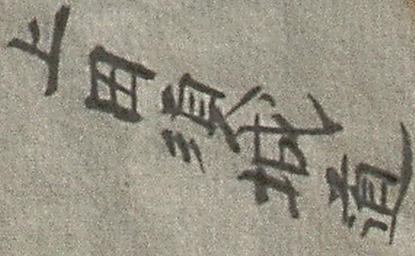上田須城道

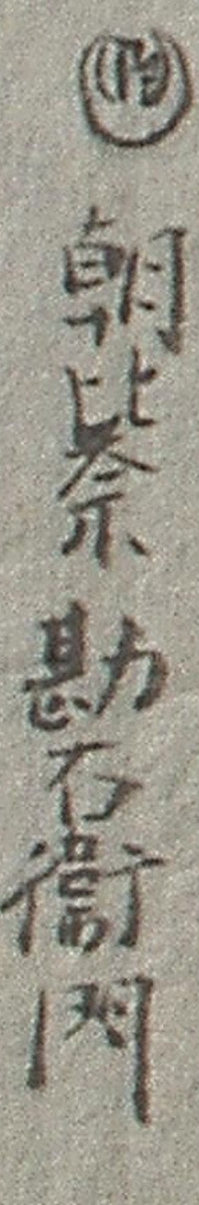朝比奈勘右衛門
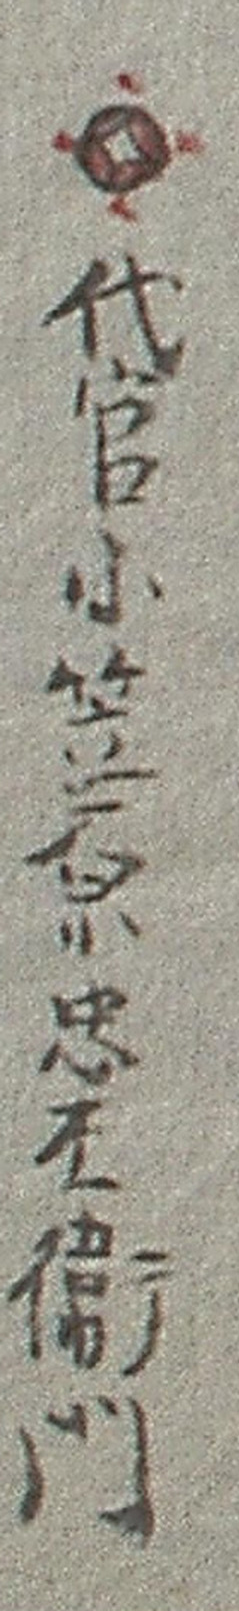代官小笠原忠左衛門
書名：天明三年癸卯六月　沙降記　［蕗原拾続巻之五十二］
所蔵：東京大学地震研究所図書室 Earthquake Research Institute Library, The University of Tokyo, JAPAN
